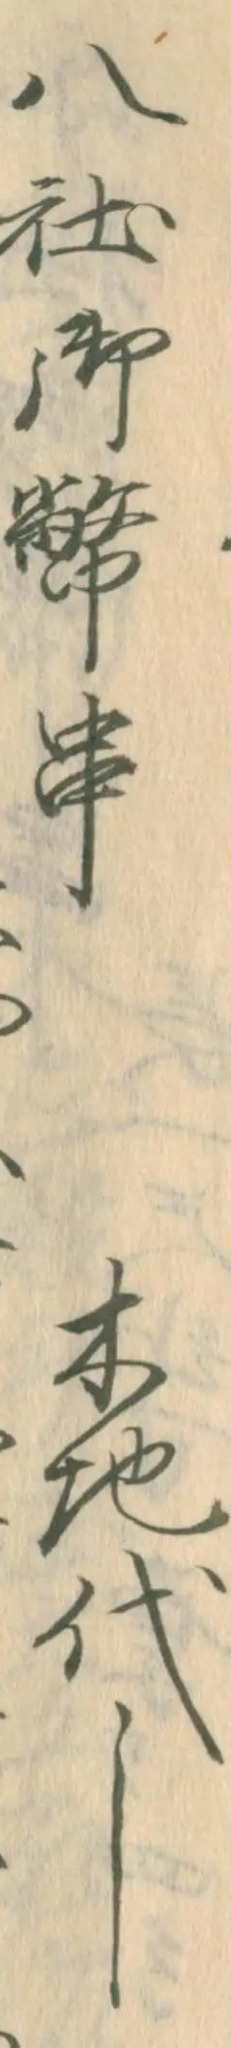八社御幣串木地代ーー
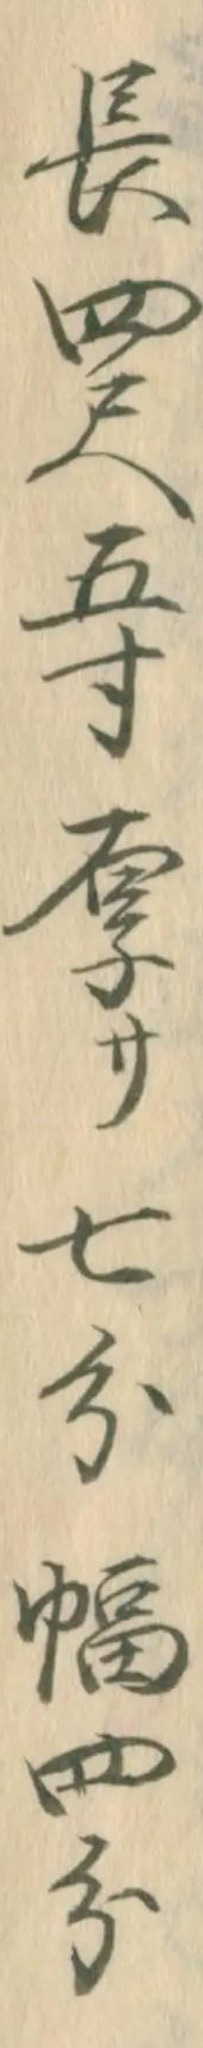長四尺五寸厚サ七分幅四分

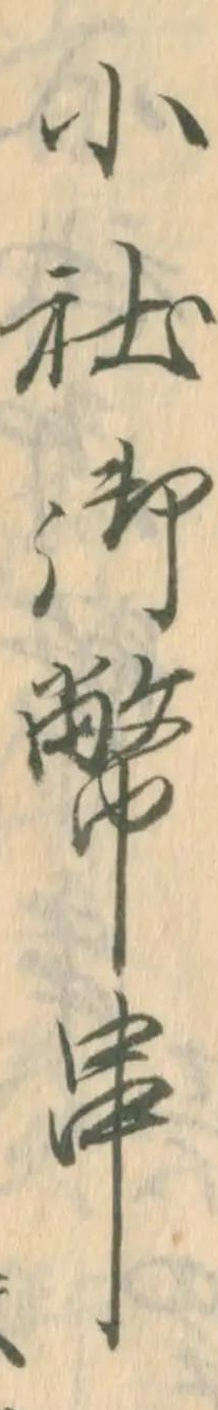小社御幣串
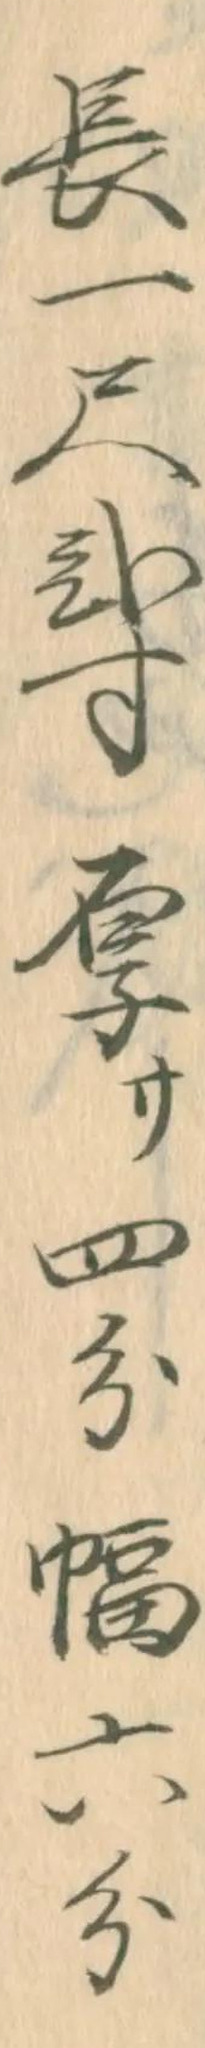長一尺弐寸厚サ四分幅六分
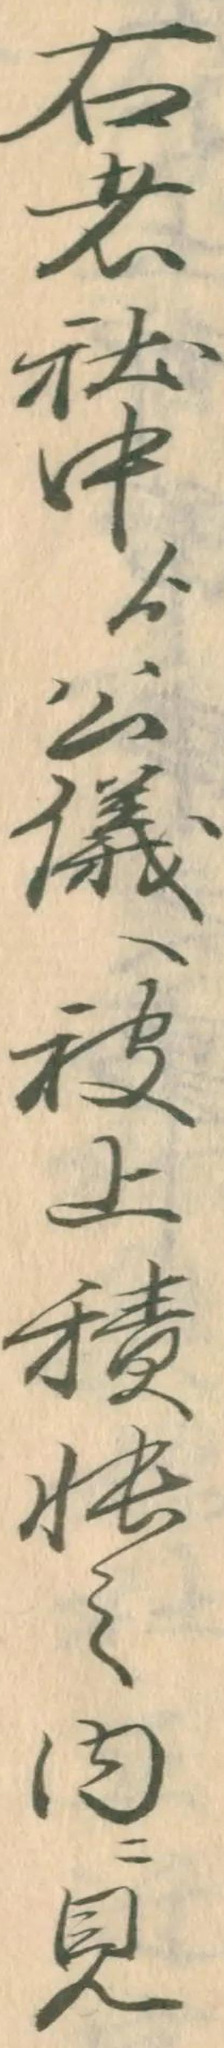右者社中ゟ公儀ヘ被上積帳之内ニ見
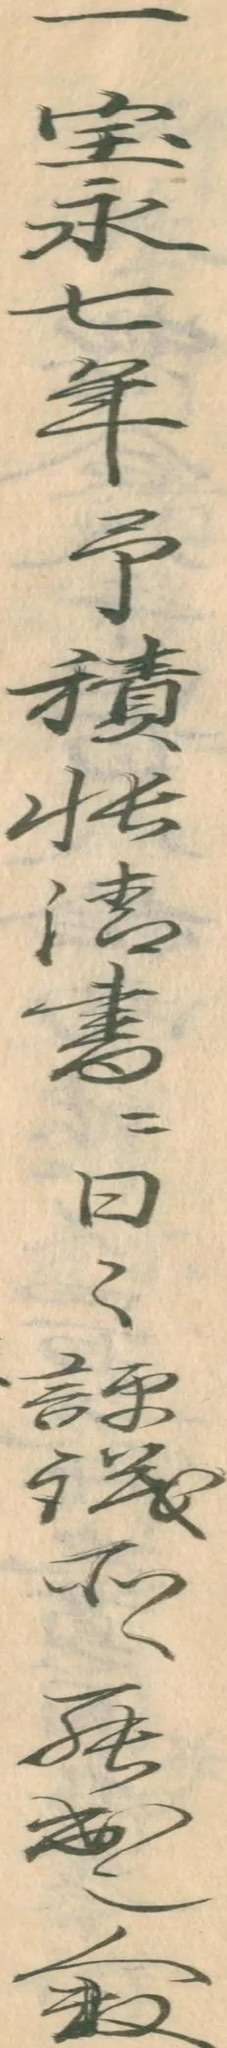一宝永七年予積帳清書ニ日々評議所へ罷出也人数
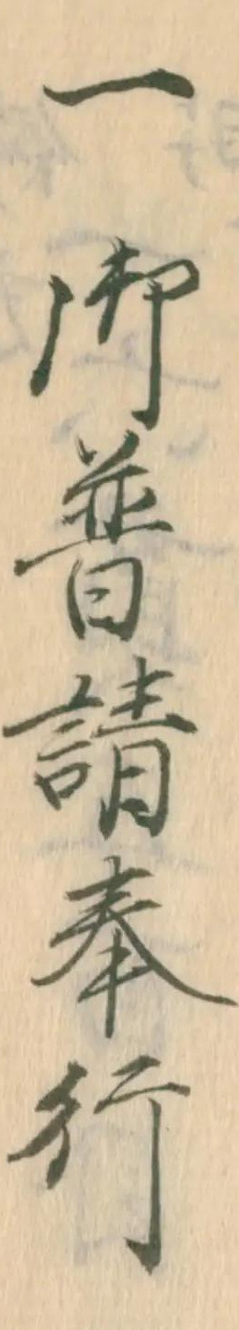一御普請奉行
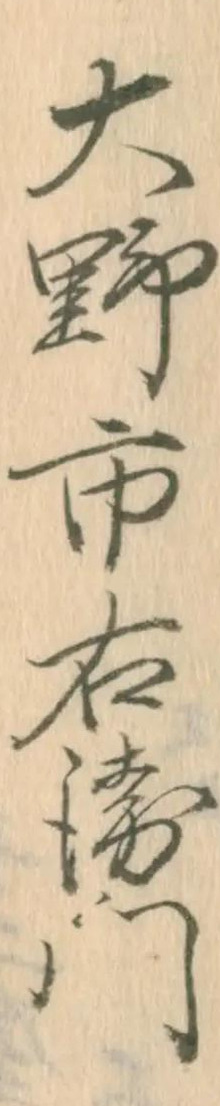大野市右衛門
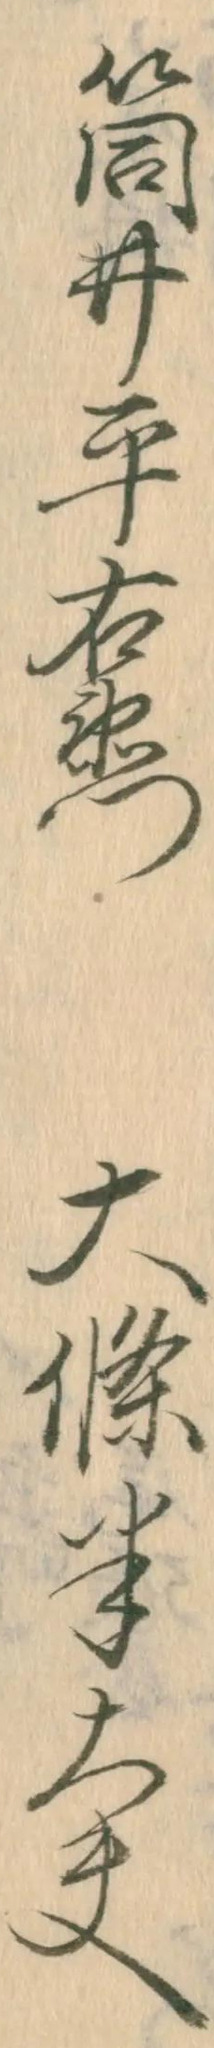筒井平右衛門大條半大夫
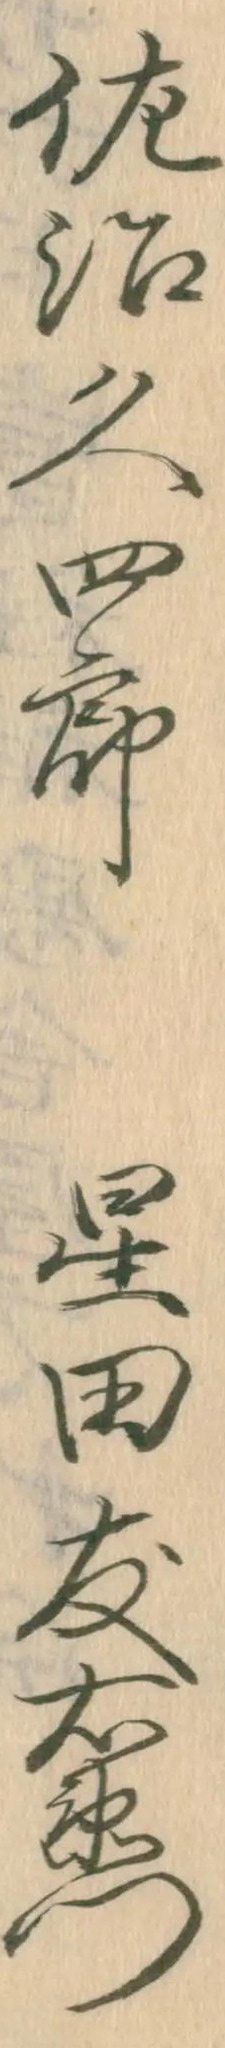佐治久四郎星田友右衛門
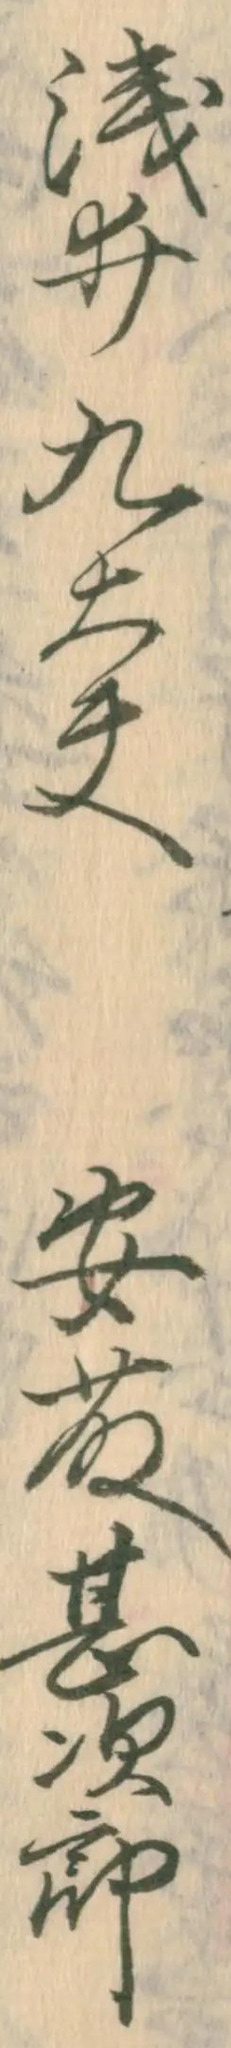浅井九大夫安藤甚次郎
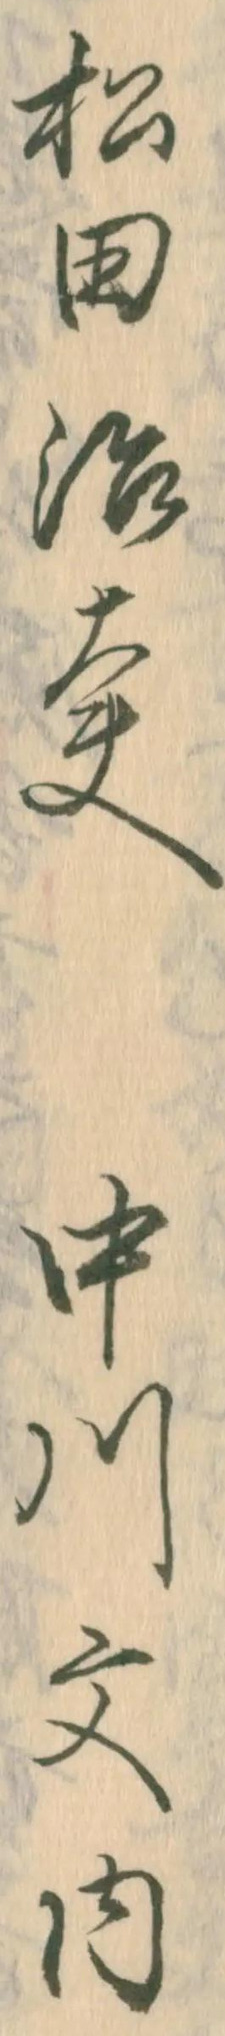松田治大夫中川文内
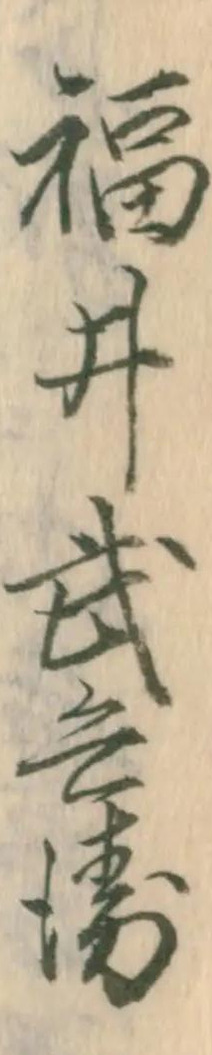福井武兵衛
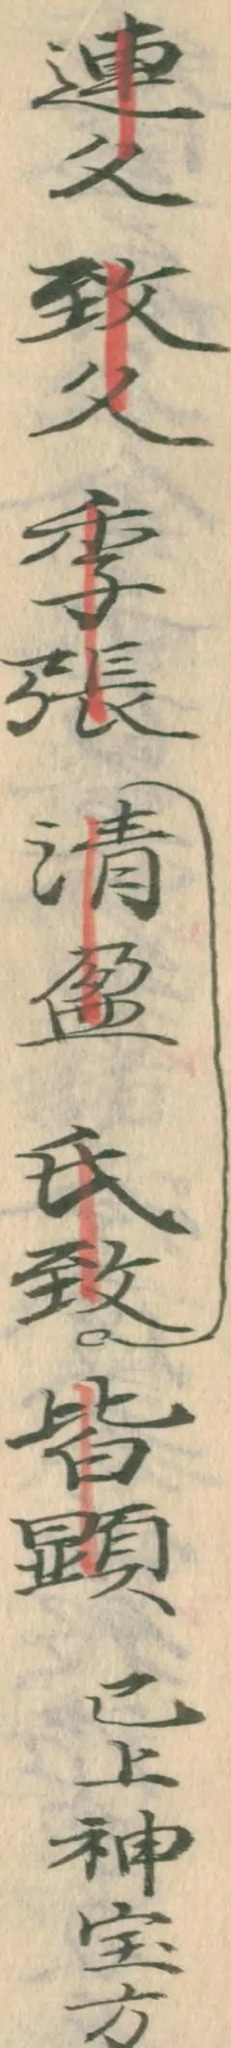連久致久季張清盈氏致￮皆顕已上神宝方
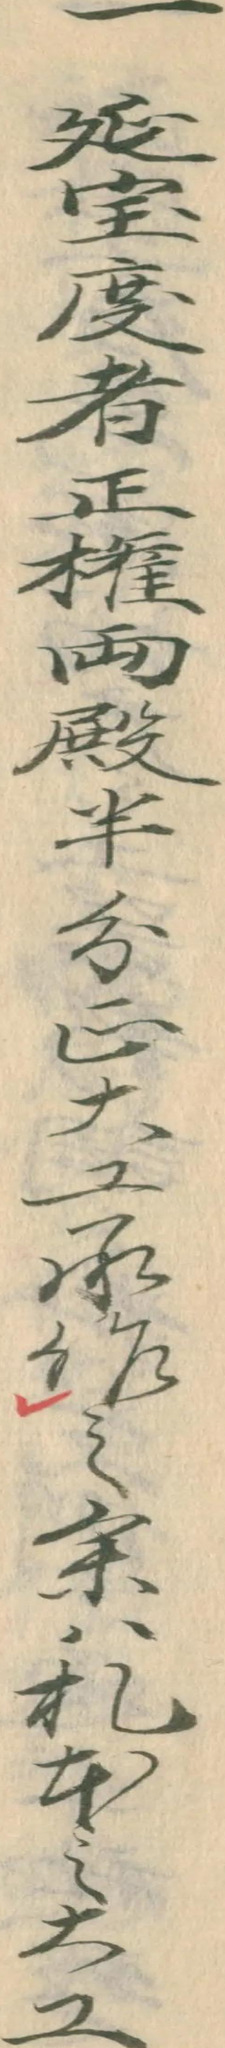一延宝度者正権両殿半分正大工承作之余ハ札本之大工

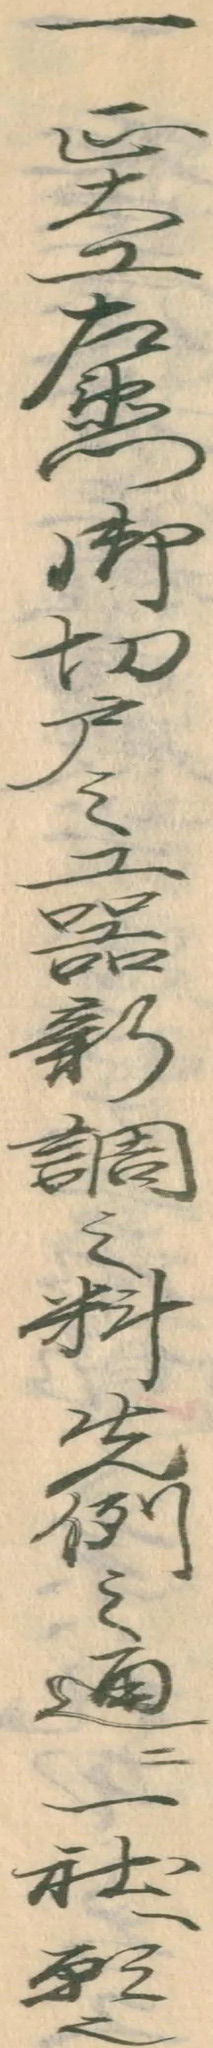一正大工左衛門御切戸之工器新調之料先例之通ニ一社へ願也
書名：賀茂社記録. 第15冊
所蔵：国立国会図書館 National Diet Library, JAPAN
